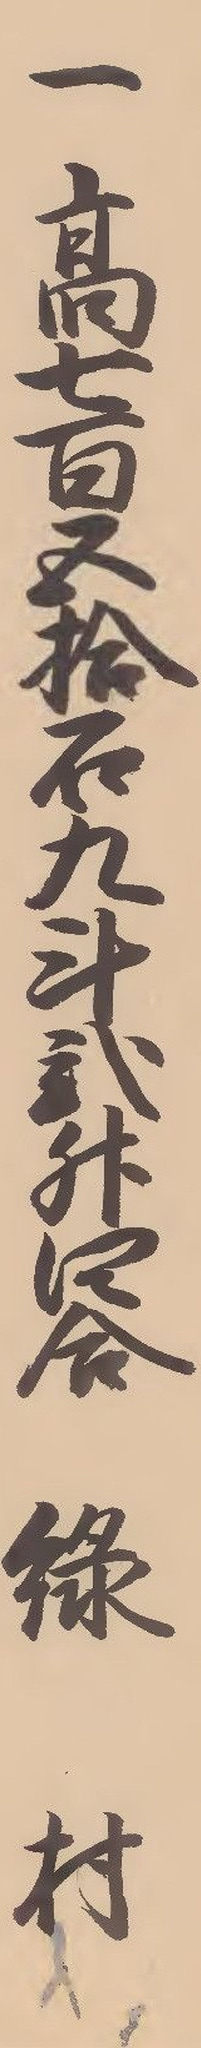一高七百五拾石九斗弐升四合緑村
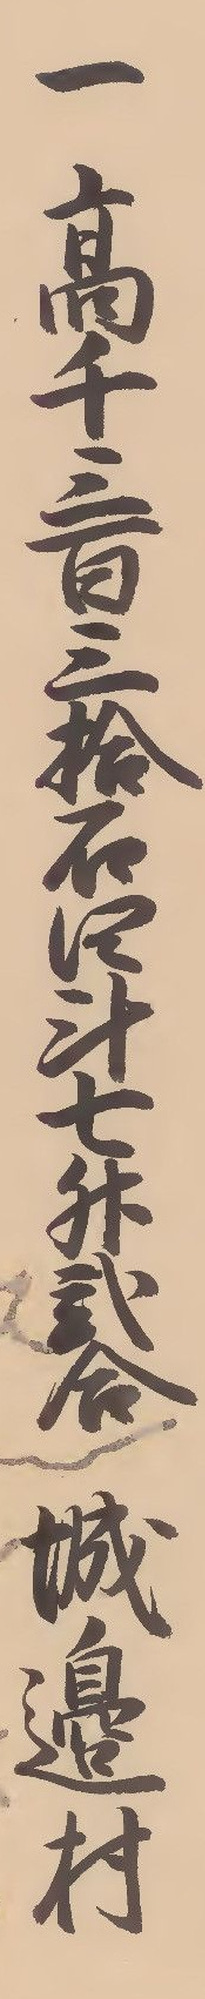一高千三百三拾石四斗七升弐合城辺村

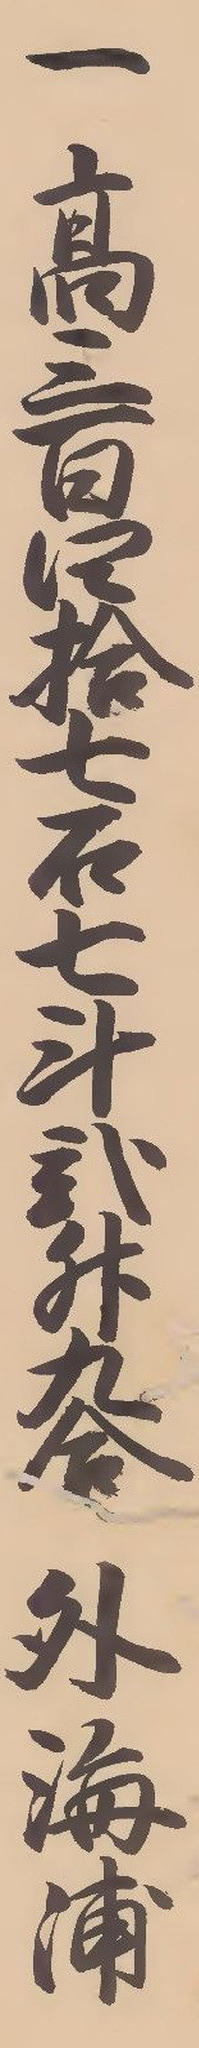一高三百四拾七石七斗弐升九合外海浦
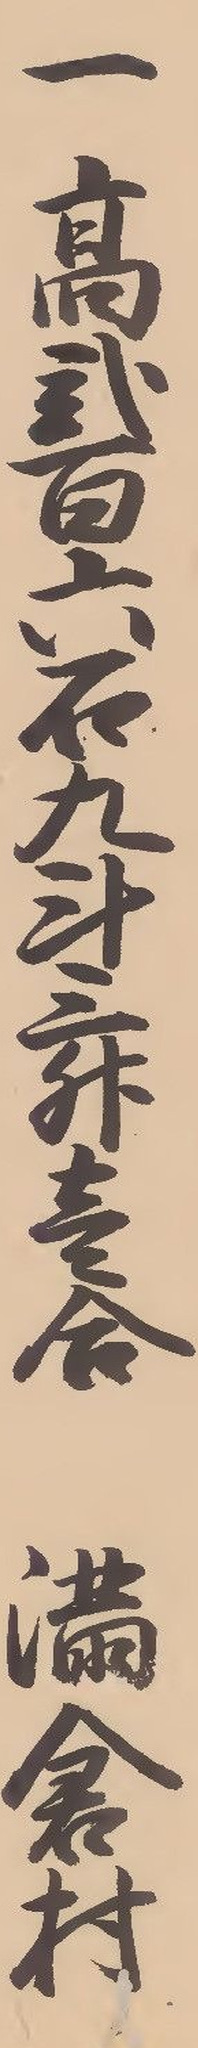一高弐百六石九斗三升壱合満倉村
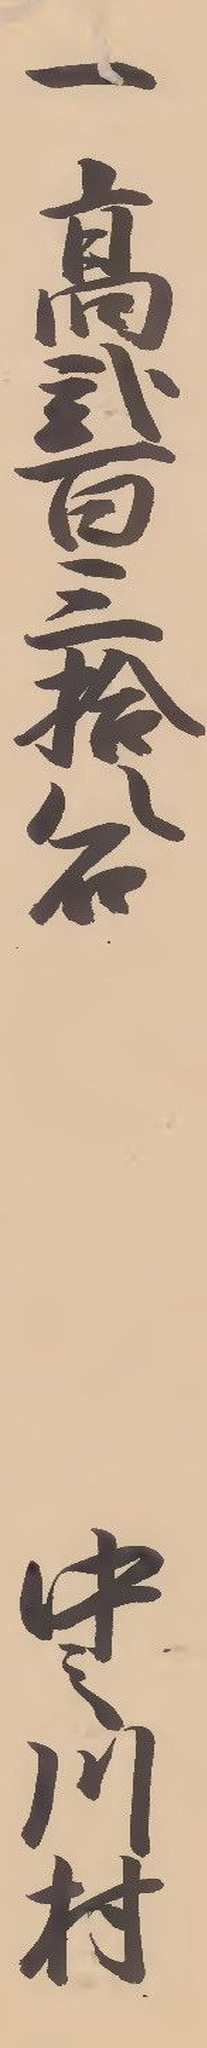一高弐百三拾八石中之川村
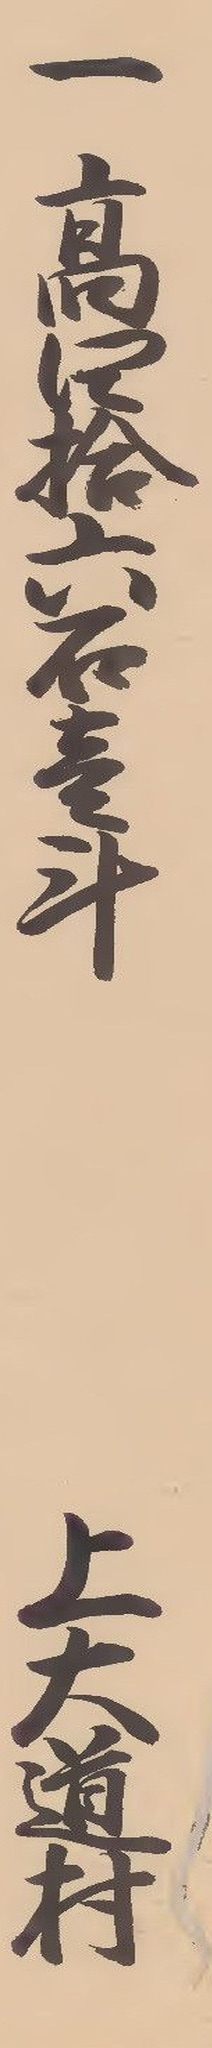一高四拾六石壱斗上大道村
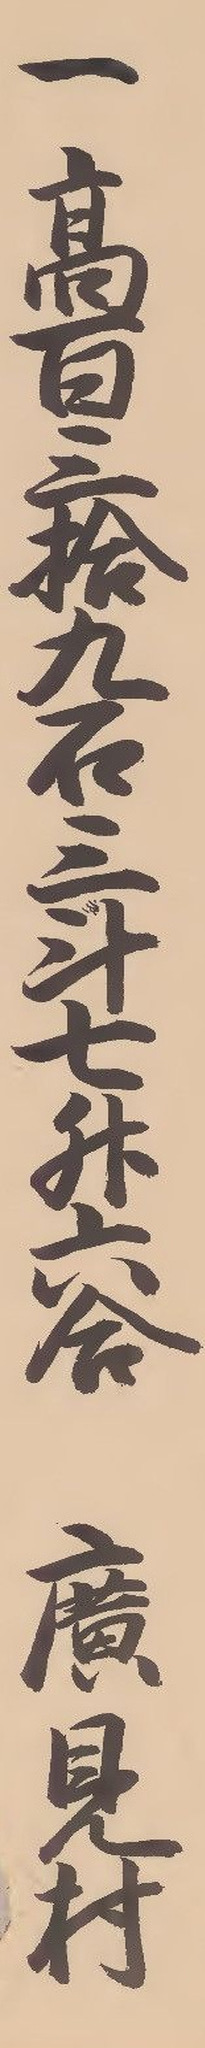一高百三拾九石三斗七升六合広見村
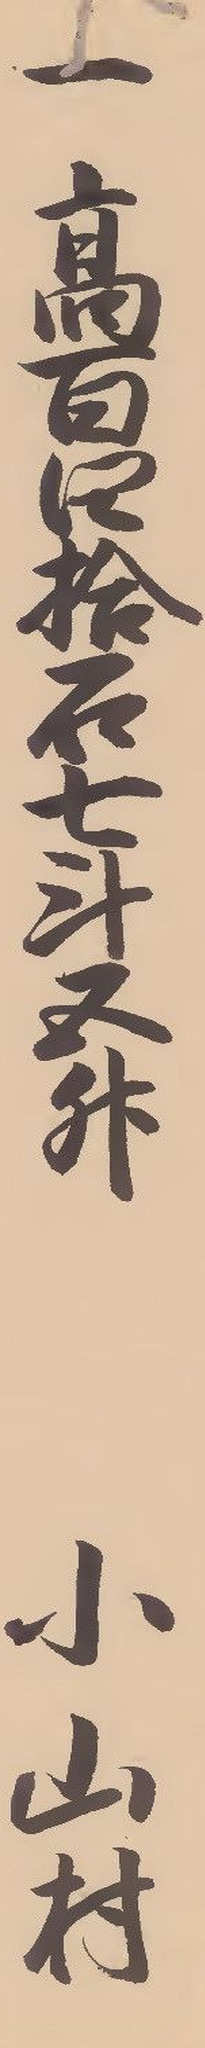一高百四拾石七斗五升小山村
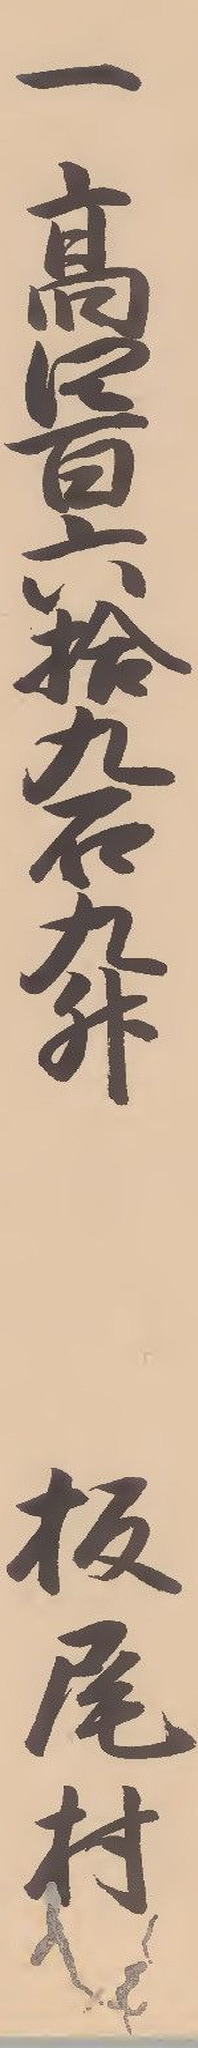一高四百六拾九石九升板尾村
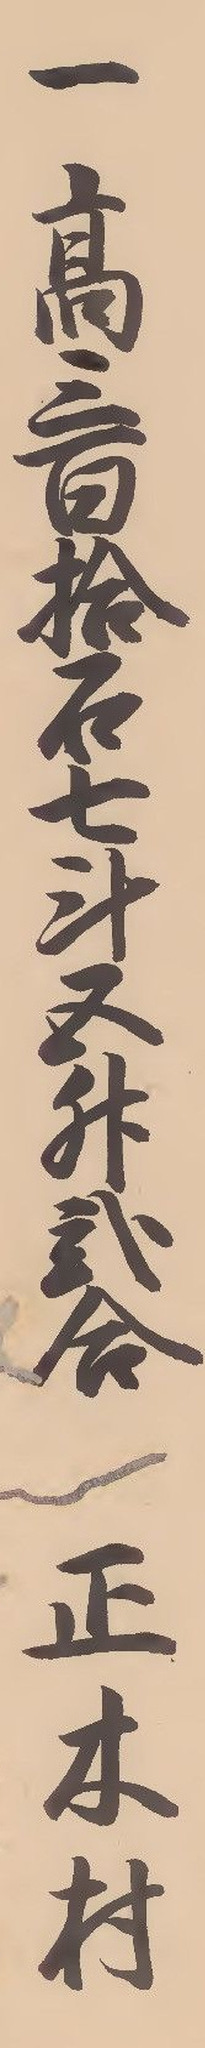一高三百拾石七斗五升弐合正木村

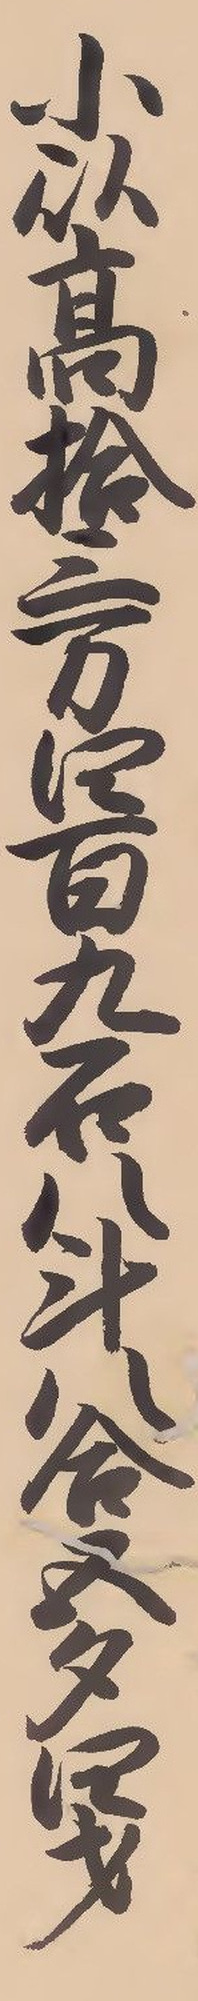小以高拾三万四百九石八斗八合五勺四才
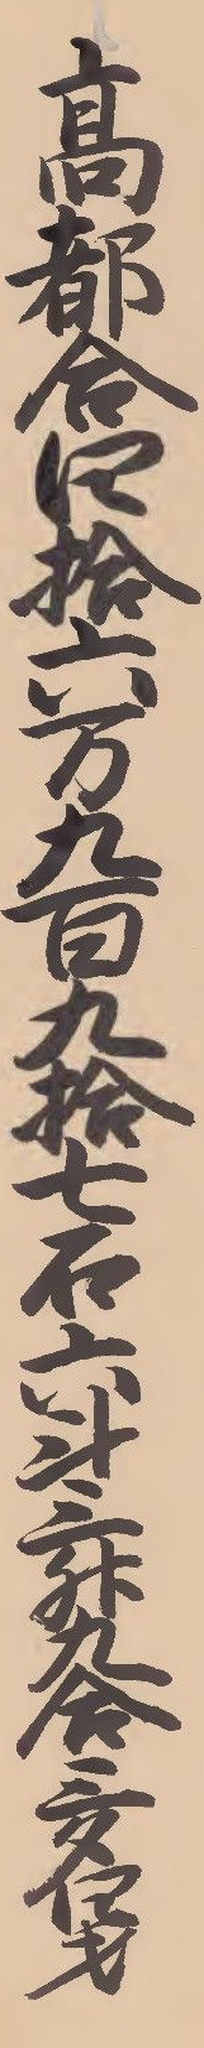高都合四拾六万九百九拾七石六斗三升九合三勺四才
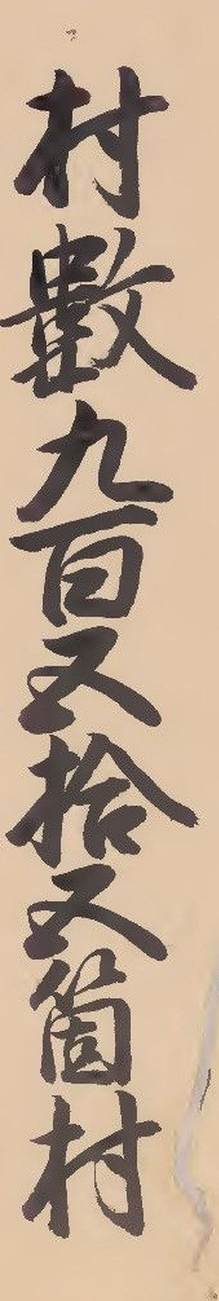村数九百五拾五箇村
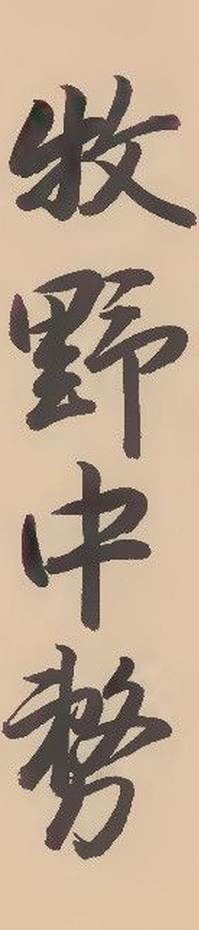牧野中務
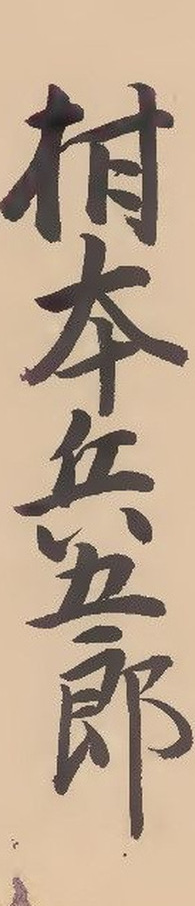柑本兵五郎
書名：伊予国郷帳
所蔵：国立公文書館 National Archives of Japan
